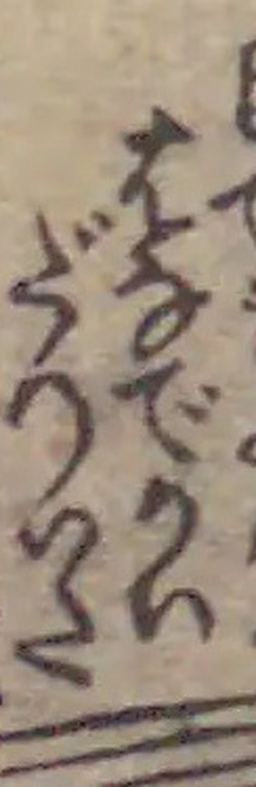だりいた
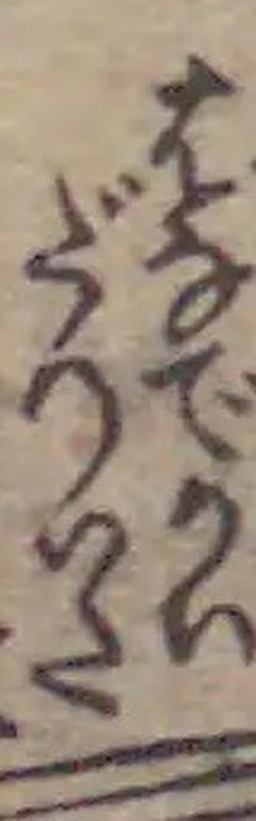だりいた
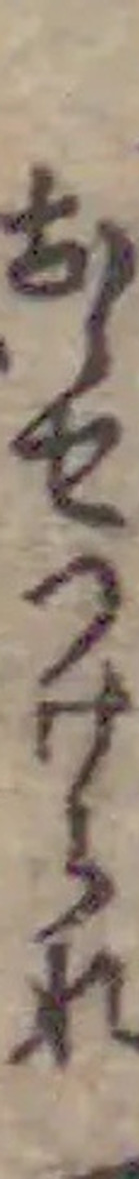おゝせつけられ
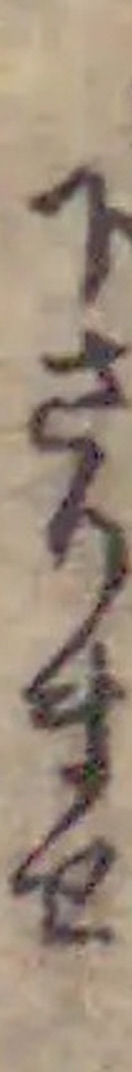下さりませ

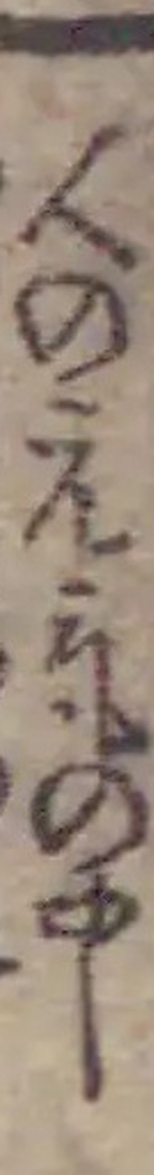人の元気のや
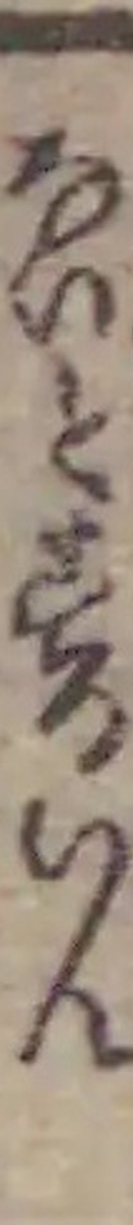しないとするいん
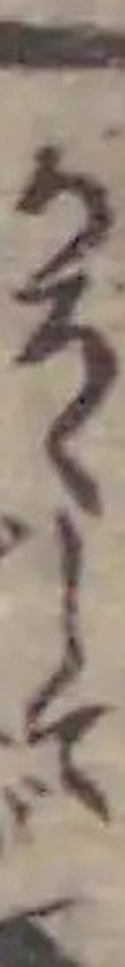かろくして
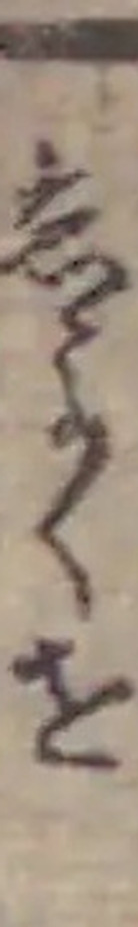しよくを
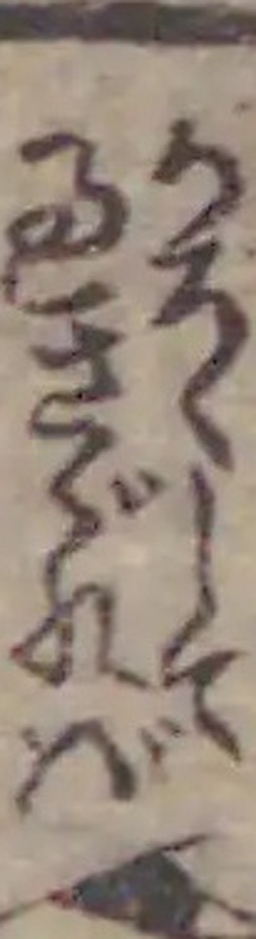すきゞれば
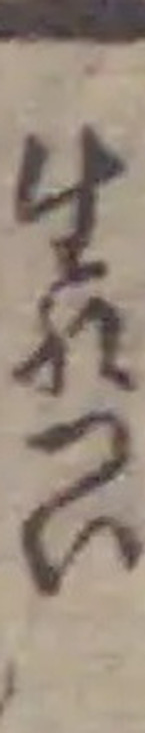生れつい
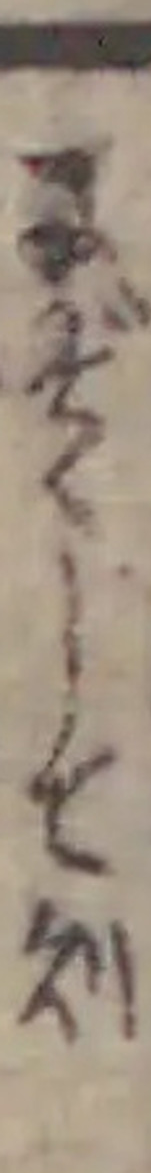にぞくして則
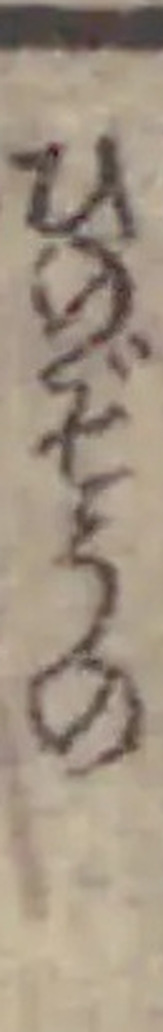ひのぞうの
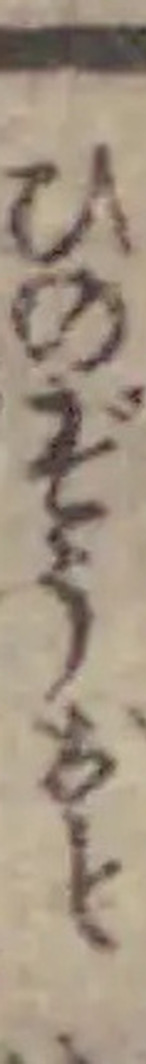ひのぞうおと
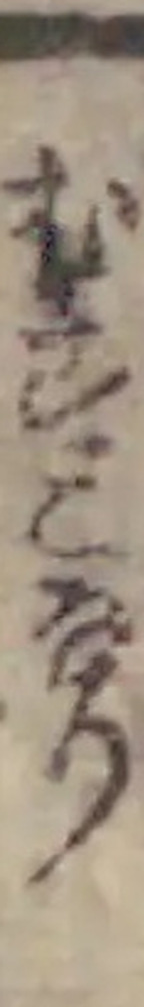むすこなり
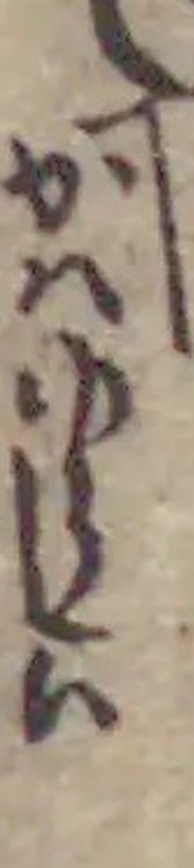〽かはゆらしい
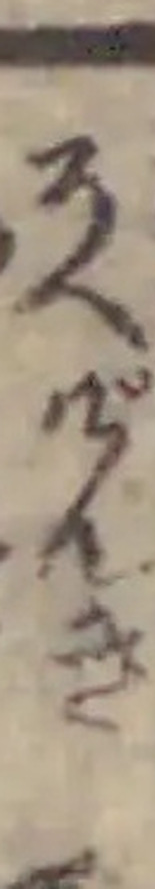ろへげんき
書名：腹内養生主論 3巻
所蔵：国立国会図書館 National Diet Library, JAPAN
